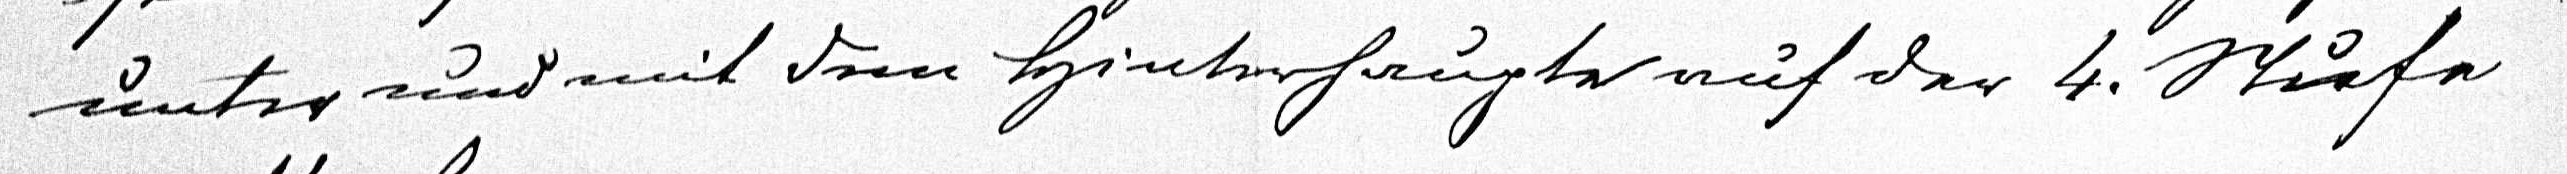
unter und mit den Hinterhaupte auf der 4. Stufe
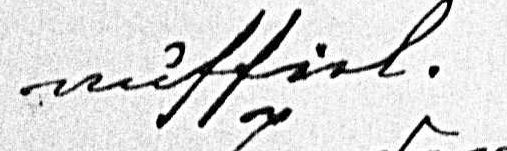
auffiel.
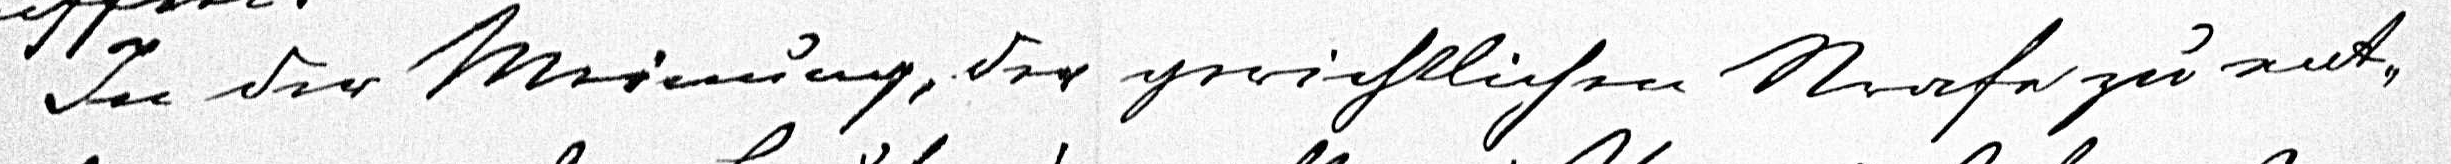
In der Meinung, der gerichtlichen Strafe zu ent¬
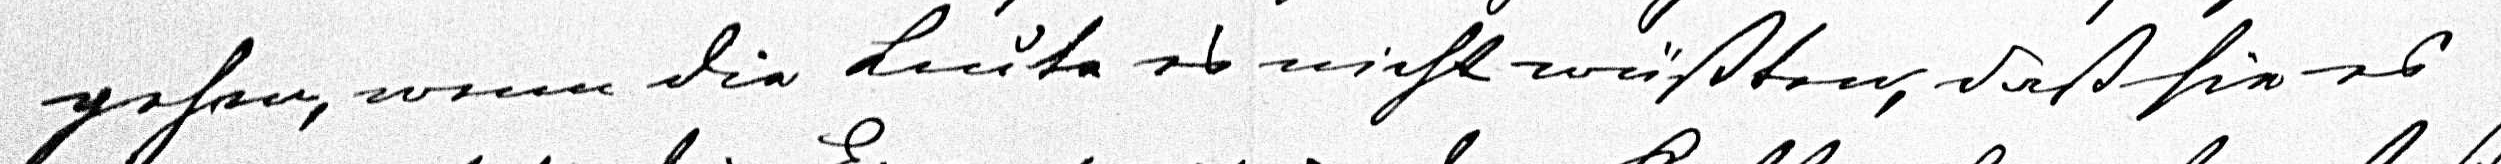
gehen, wenn die Leute es nicht wüßten, daß sie es
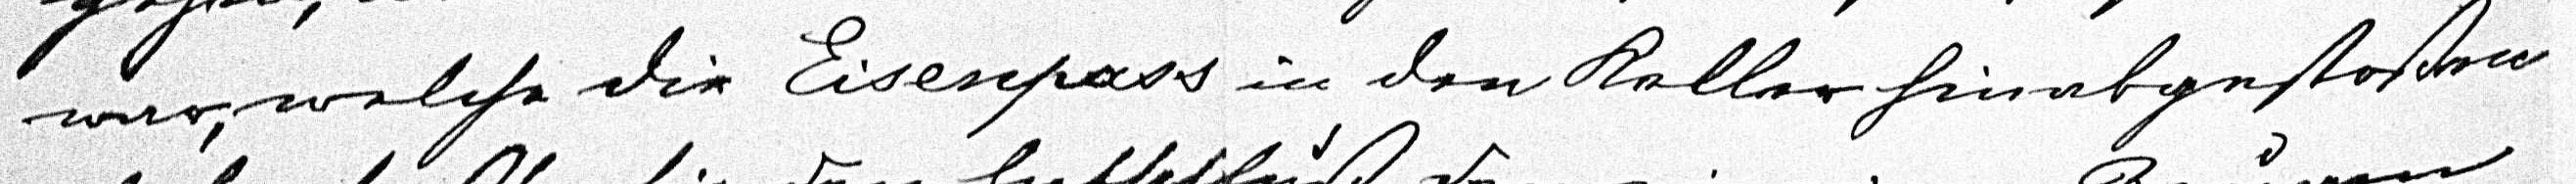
war, welche die Eisenpass in den Keller hinabgestoßen
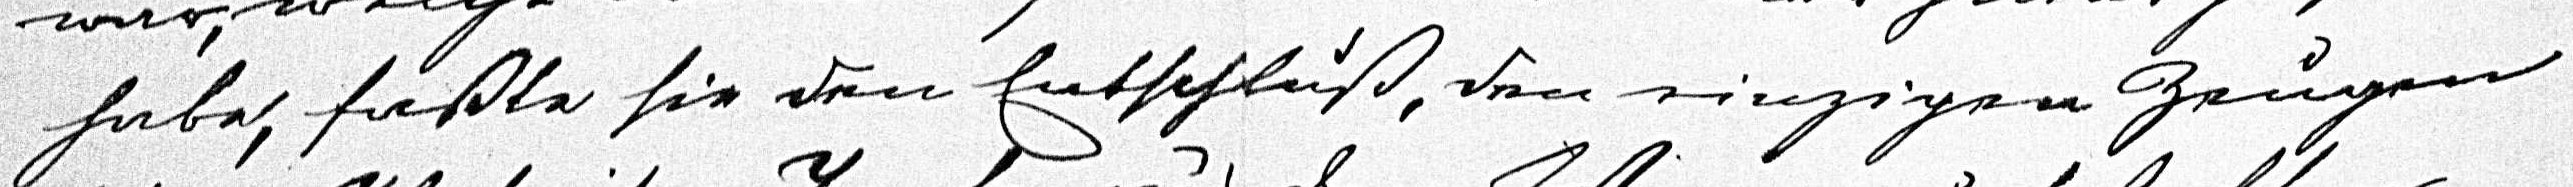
habe, faßte sie den Entschluß, den einzigen Zeugen
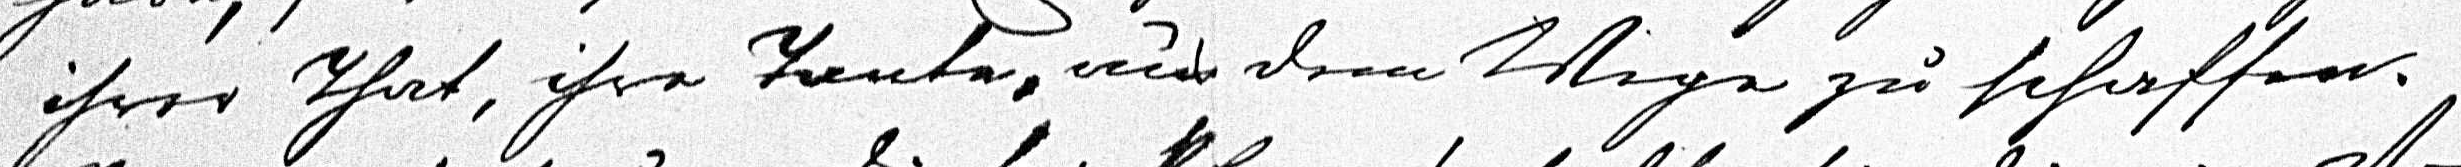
ihrer That, ihre Tante, aus dem Wege zu schaffen.
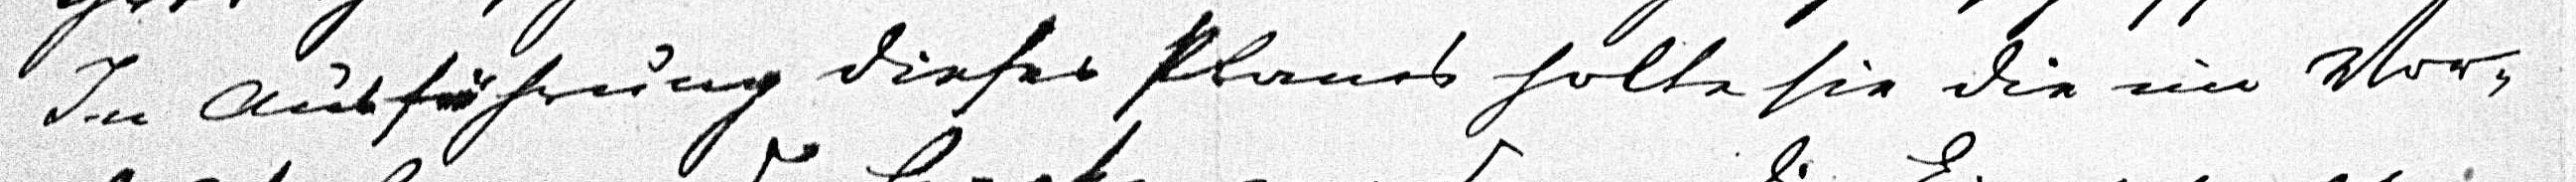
In Ausführung dieses Planes holte sie die im Vor¬
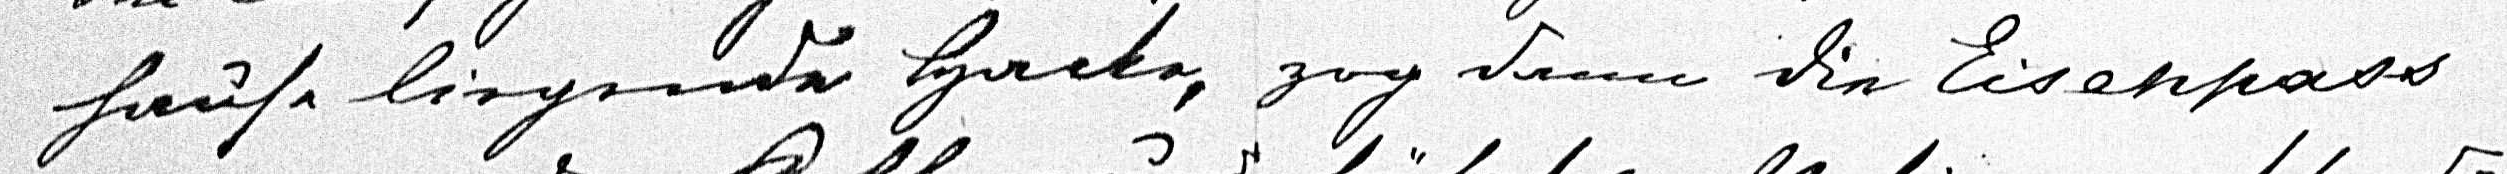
hause liegende Hacke, zog dann die Eisenpass
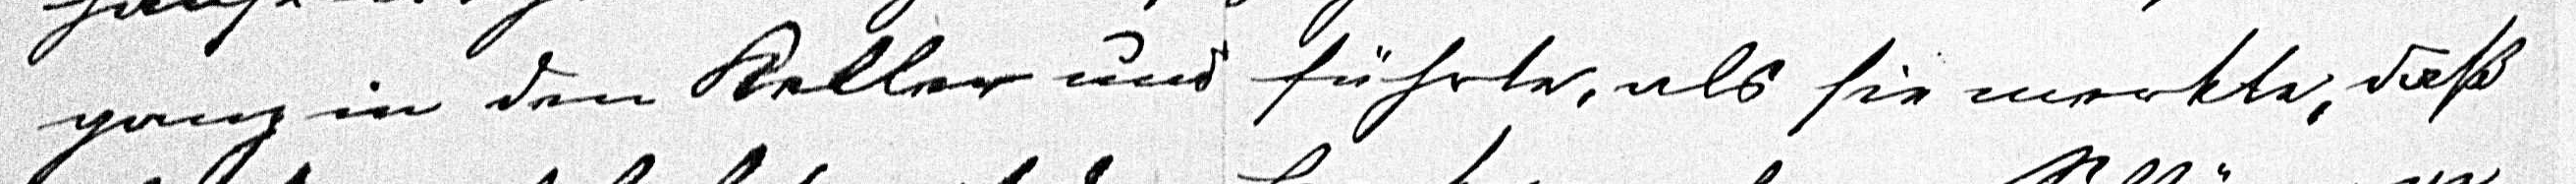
ganz in den Keller und führte, als sie merkte, daß
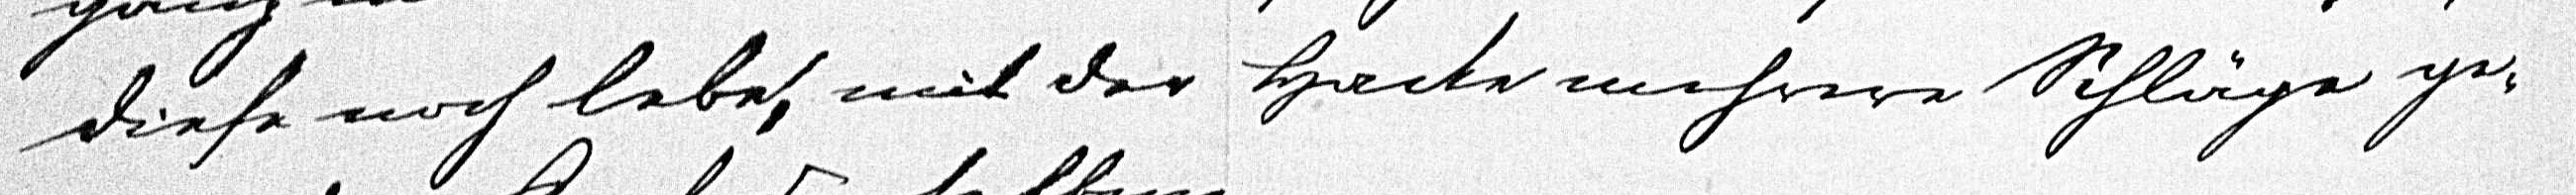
diese noch lebe, mit der Hacke mehrere Schläge ge¬
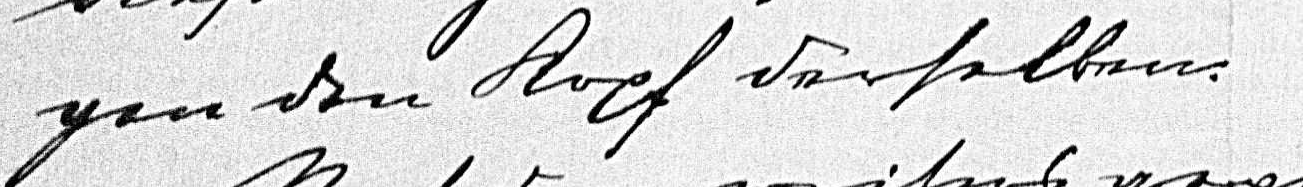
en den Kopf derselben.
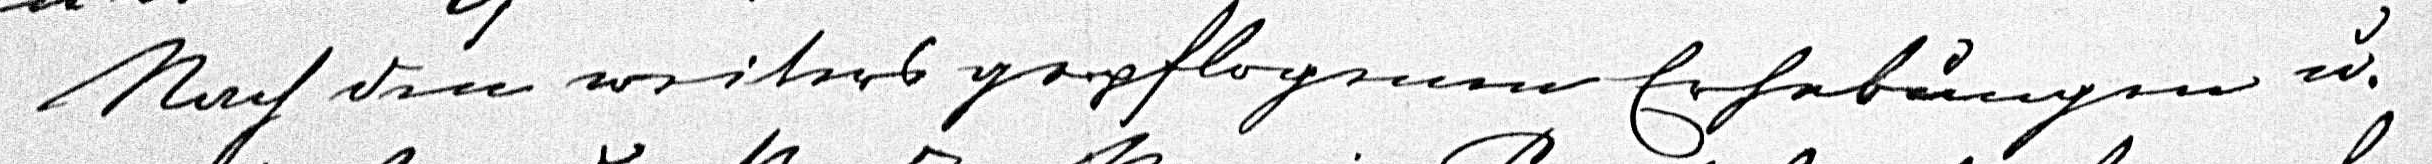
Nach den weiters gepflogenen Erhebungen u.
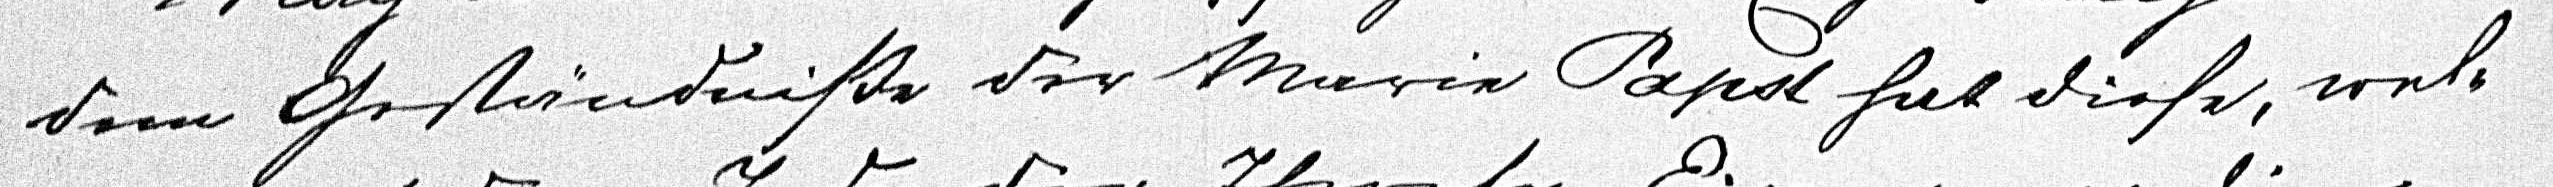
dem Geständniße der Marie Papst hat diese, wel¬
